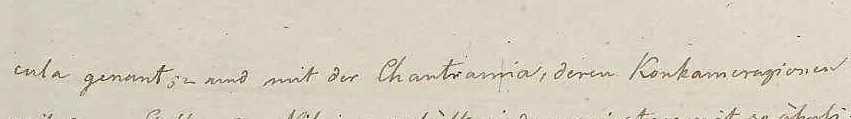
cula genant; – und mit der Chantramnia, deren Konkamerazionen
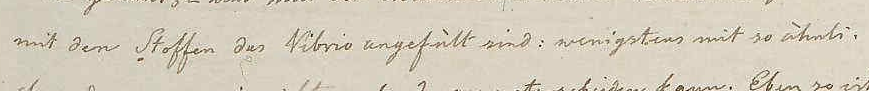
mit den Stoffen das Vibrio angefült sind: wenigstens mit so ähnli-
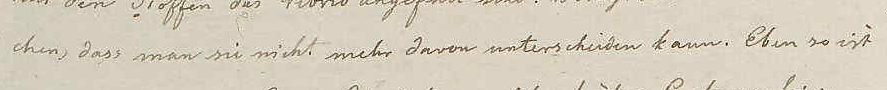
chen, dass man sie nicht mehr davon unterscheiden kann. Eben so ist
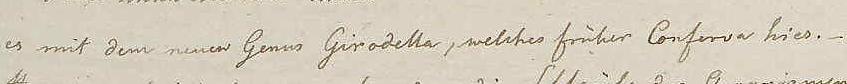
es mit dem neuen Genus Girodella, welches früher Conferva hies. –
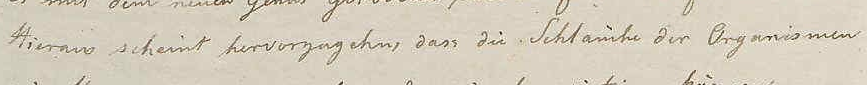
Hieraus scheint hervorzugehn, dass die Schläuche er Organismen
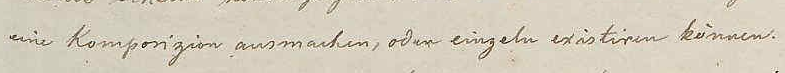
eine Komposizion ausmachen, oder einzeln existiren können.
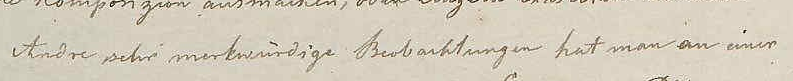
Andre sehr merkwürdige Beobachtungen hat man an einer
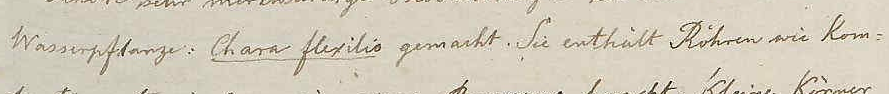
Wasserpflanze: Chara flexilis gemacht. Sie enthält Röhren wie Kom-
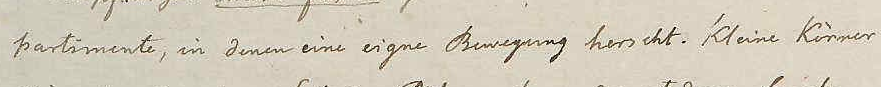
partimente, in denen eigne Bewegung herscht. Kleine Körner
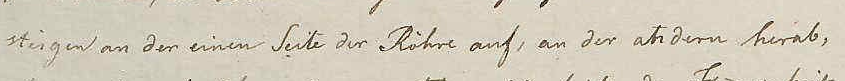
steigen an der einen Seite der Röhre auf, an der andern herab,
